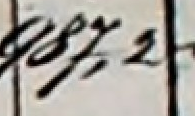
987,2
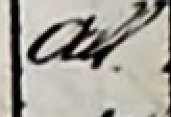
Alt.
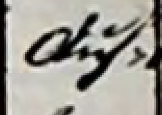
Aus„
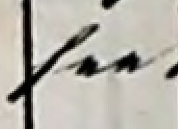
see
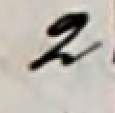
2
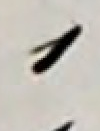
1
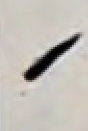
1
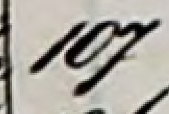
107
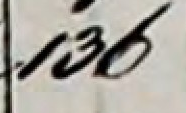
136
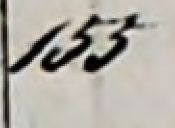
155
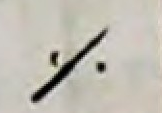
./.
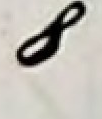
8
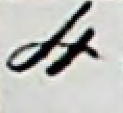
4
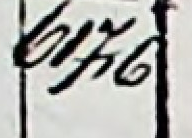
617,6
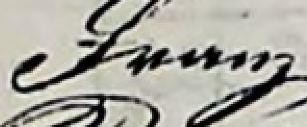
Franz
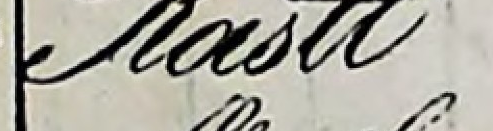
Rastl
